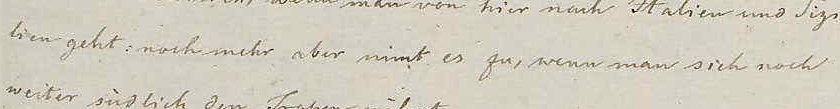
lien geht: noch mehr aber nimt es zu, wenn man sich noch
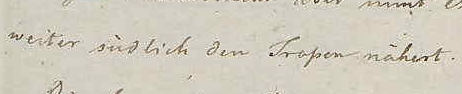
weiter südlich den Tropen nähert.
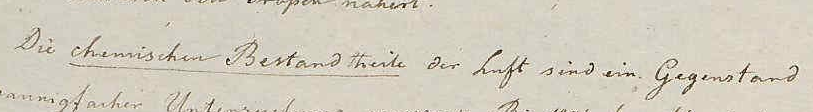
Die chemischen Bestandtheile der Luft sind ein Gegenstand
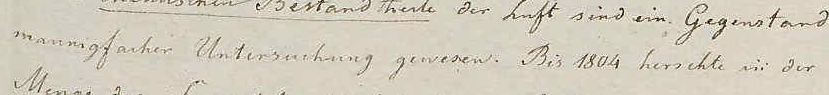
mannigfacher Untersuchung gewesen. Bis 1804 herschte in der
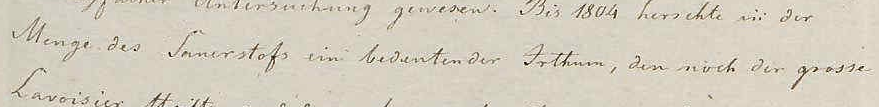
Menge des Sauerstofs ein bedeutender Irthum, den noch der grosse
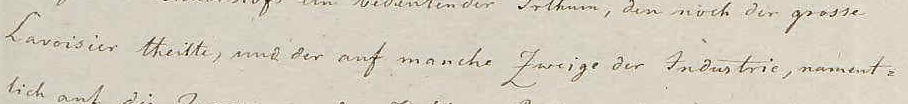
Lavoisier theilte, und der auf manche Zweige der Industrie, nament-
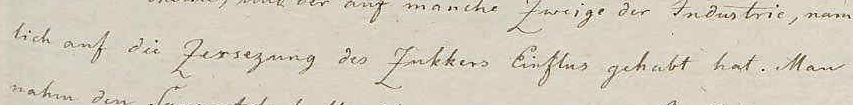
lich auf die Zersezung des Zukkers Einflus gehabt hat. Man
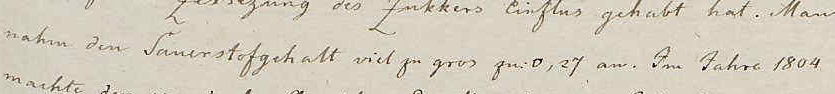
nahm den Sauerstofgehalt viel zu gros zu: 0,27 an. Im Jahre 1804
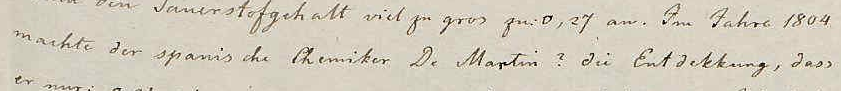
machte der spanische Chemiker De Martin ? die Entdekkung, dass
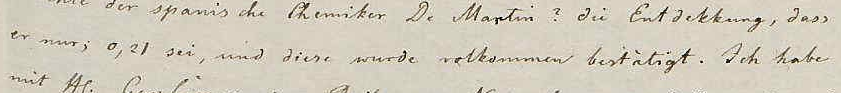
er nur 0,21 sei, und diese wurde volkommen bestätigt. Ich habe
